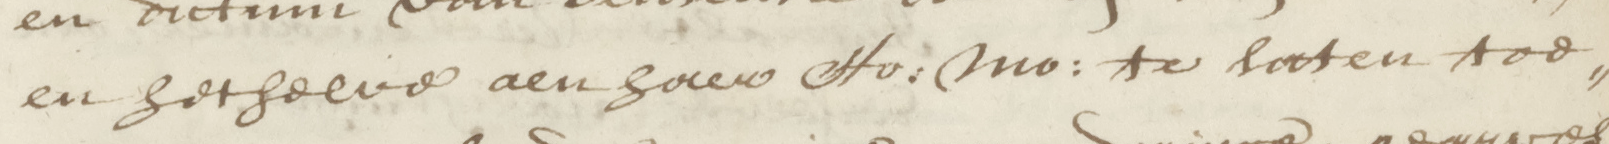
en hetselve aen haer Ho:Mo: te laten toe„
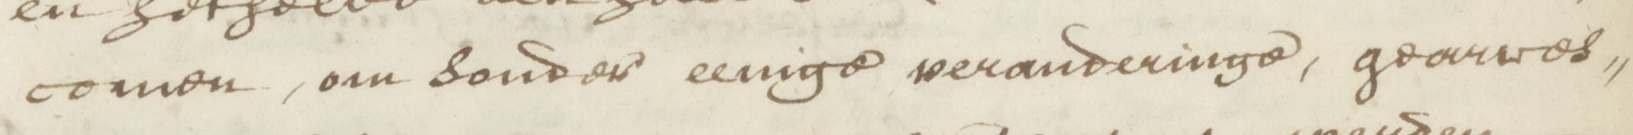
comen, om sonder eenige veranderinge, gearres„
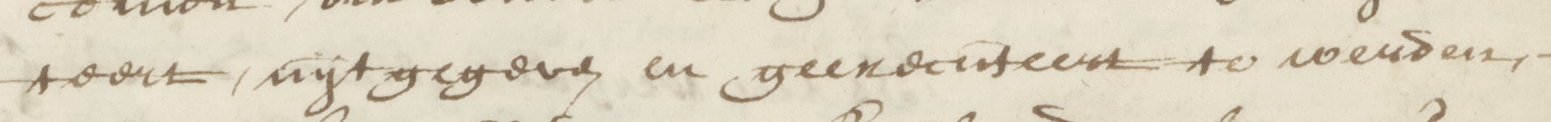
teert, uijtgegeven en geexecuteert te werden,
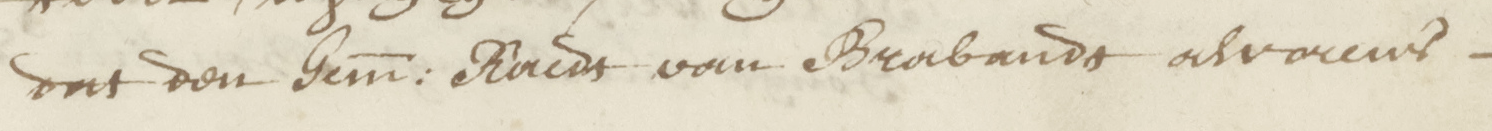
dat den Gem: Raedt van Brabandt alvorens
